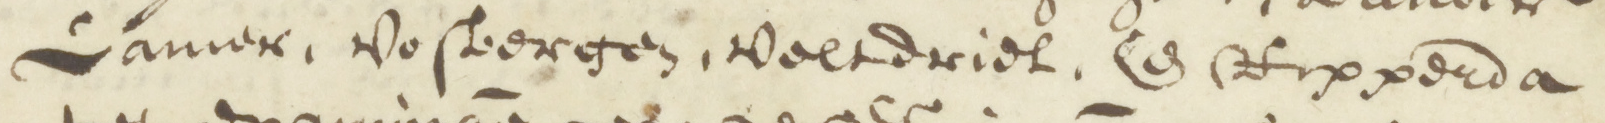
Camer, Vosbergen, Veltdriel & Ripperda
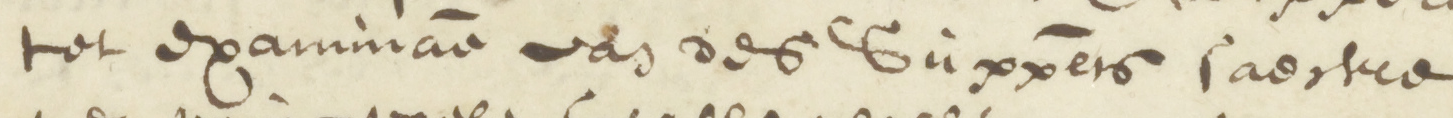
tot examinae van des supplts saecke
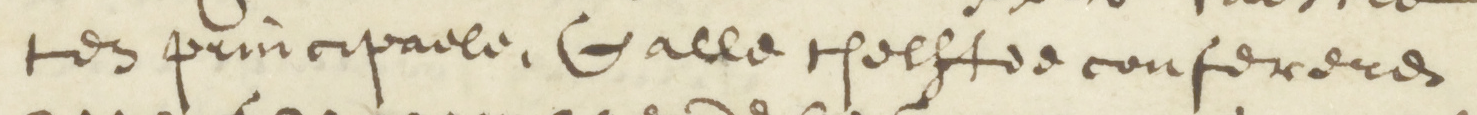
ten principaele, & alle tselffde confereren
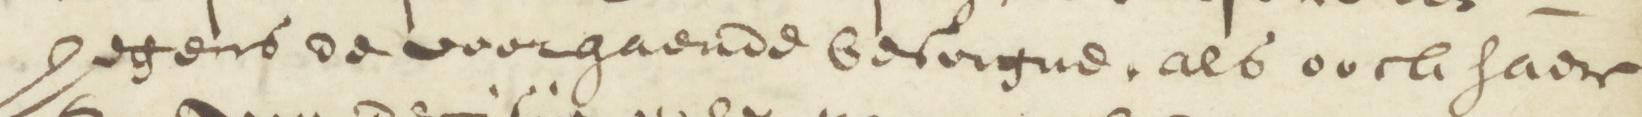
Jegens de voorgaende besoigne als oock Haer
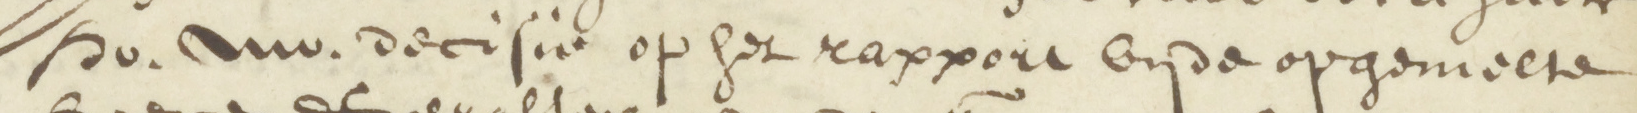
Ho:Mo: decisie op het rapport bij de opgemelte
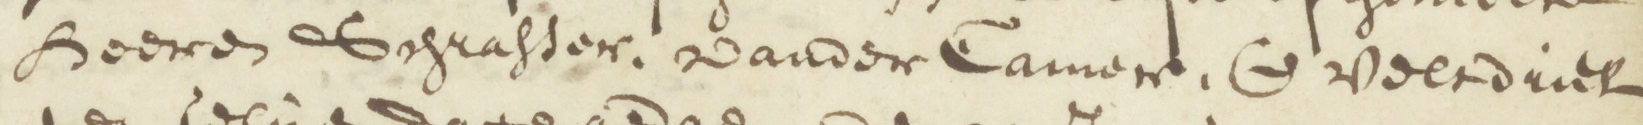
heeren Schrasse, vander Camer, & Veltdriel
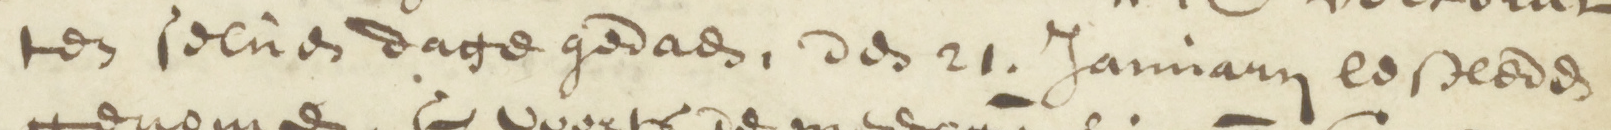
ten selven dage gedaen, den 21 Januarij lestleden
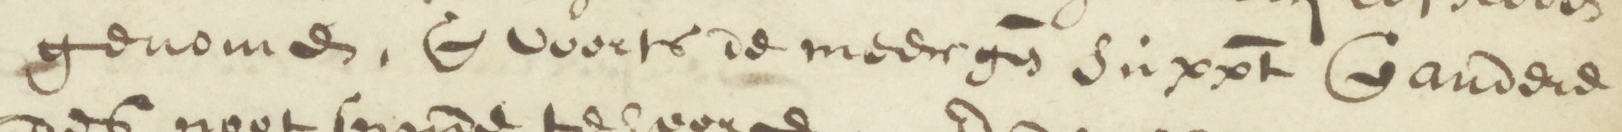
genomen, & voorts te meergem suppt & andere
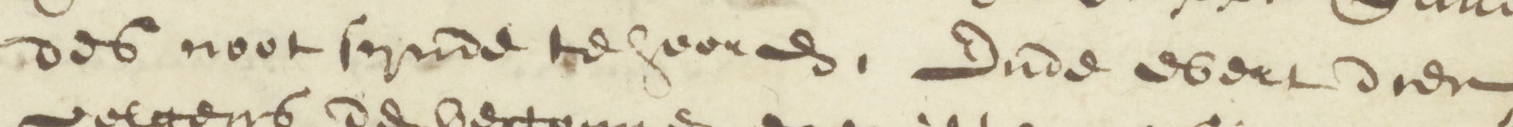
des noot synde te hooren. Ende wert dien,,
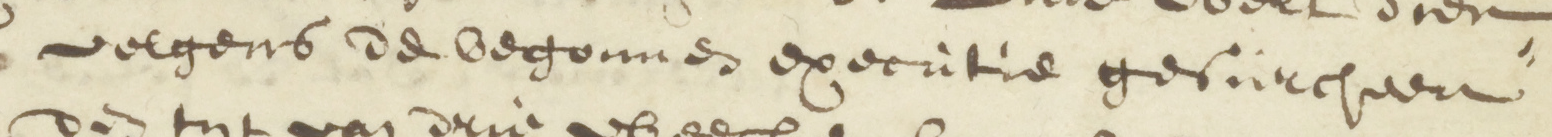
volgens de begonnen executie gesurcheert
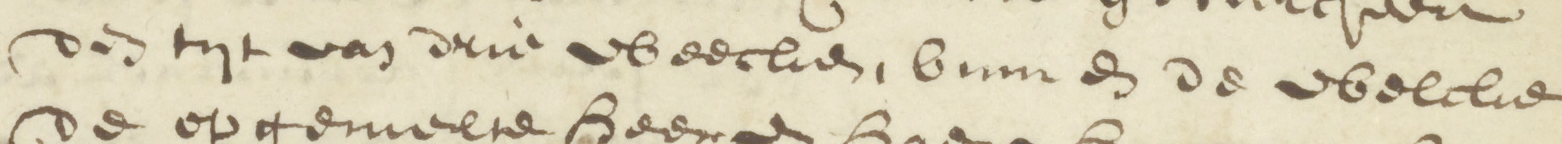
den tyt van drie weecken, binnen de welcke
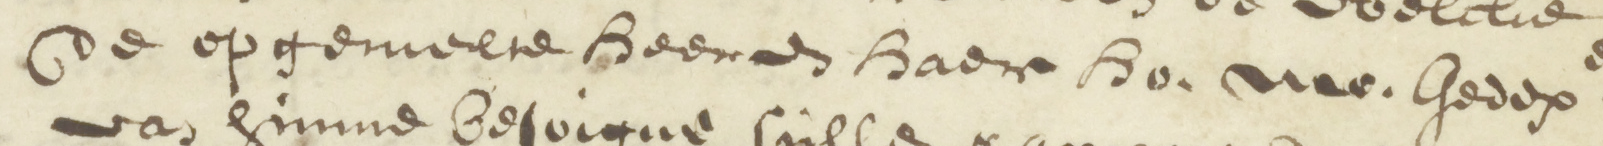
de opgemelte heeren Haer Ho:Mo: Gedepen.
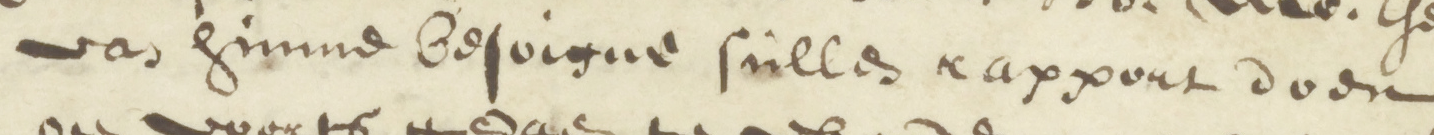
van hunnen besoigne sullen rapport doen
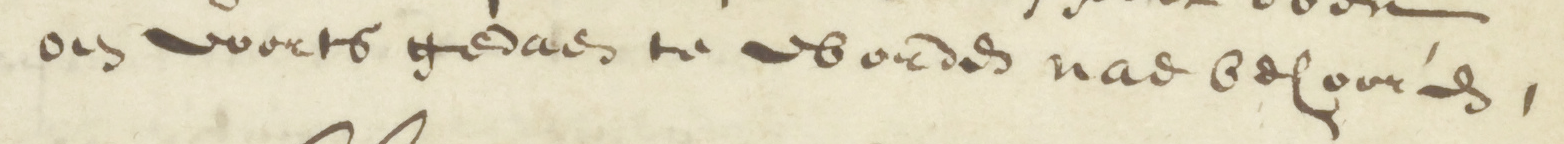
om voorts gedaen te worden nae behooren.
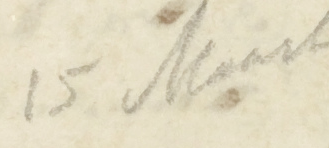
15 Maart
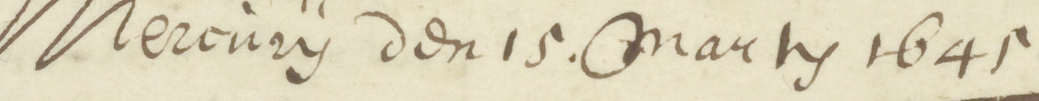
Mercurij den 15. Marty 1641.
